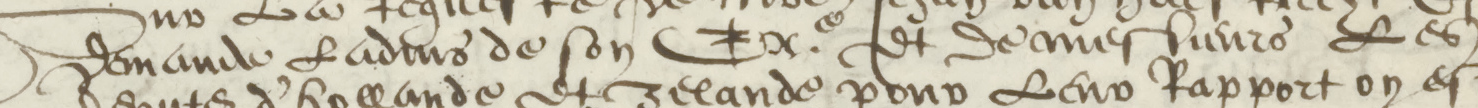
demande laduis de son Exe. et de messieurs les
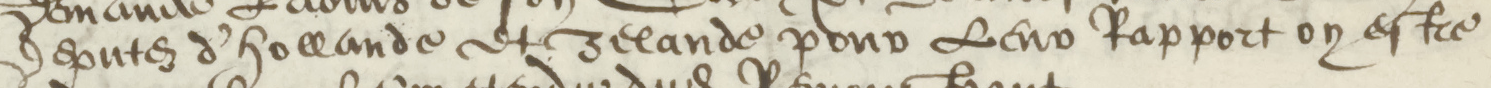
deputez d'hollande et Zelande pour leur Rapport on estre
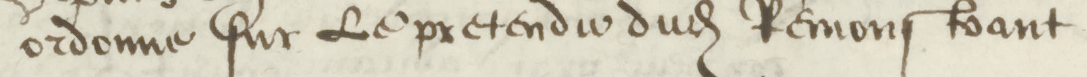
ordonne sur le pretendu dud Remonstrant
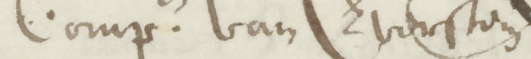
Compe. van Everstein
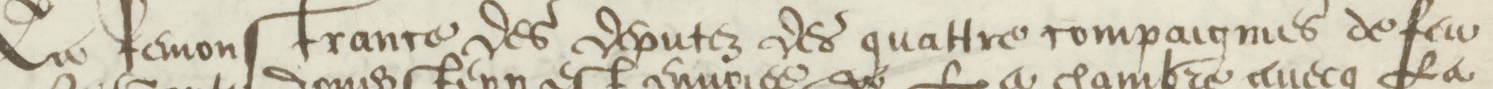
La Remonstrance des deputez des quattre compaignies de feu
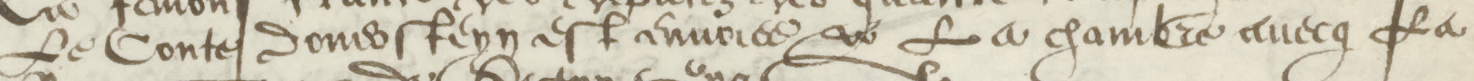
le Conte Douersteyn est, enuoiee a la chambre auecq la
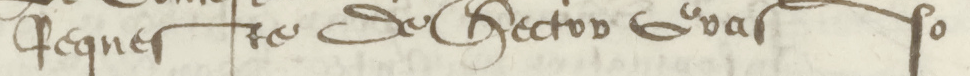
Requeste de Hector Grasso
